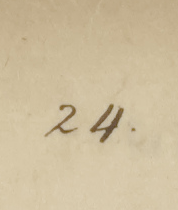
24.
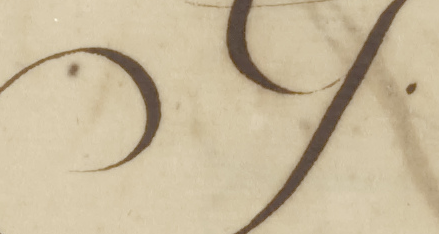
G.
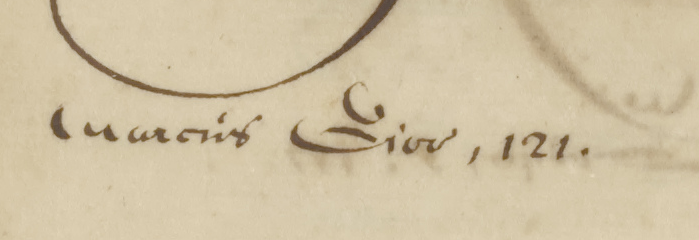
Marcus Gior, 121.
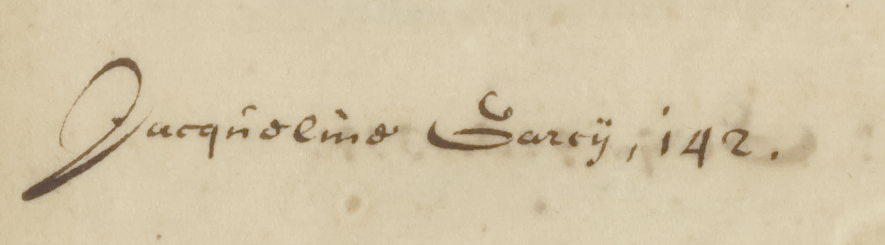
Jacqueline Garcij, 142.
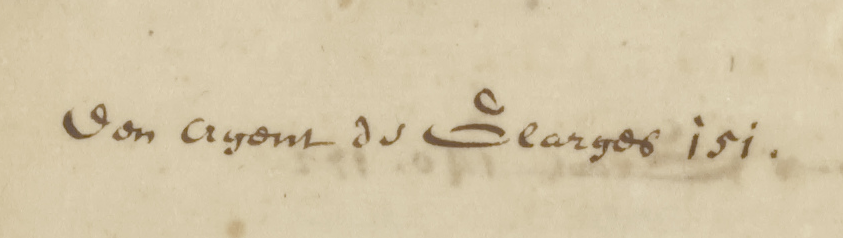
Den Agent de Glarges 151.
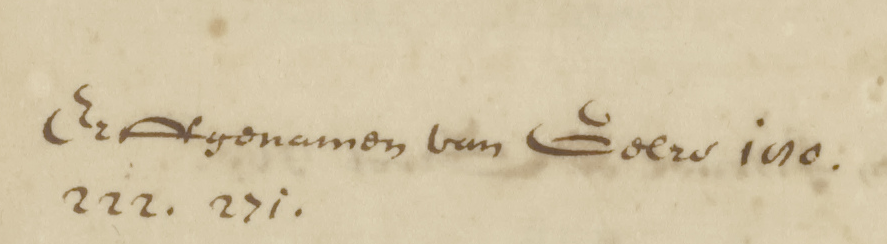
Erffgenamen van Gelre 180.
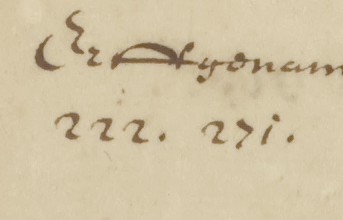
222. 271.
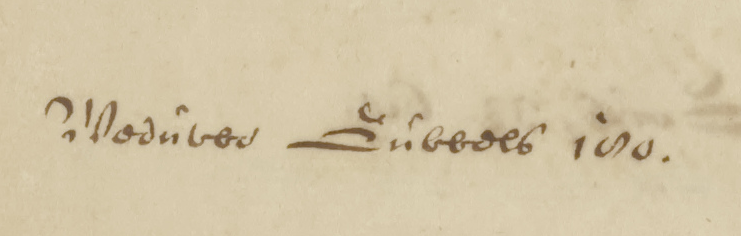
Weduwe Gubbels 180.
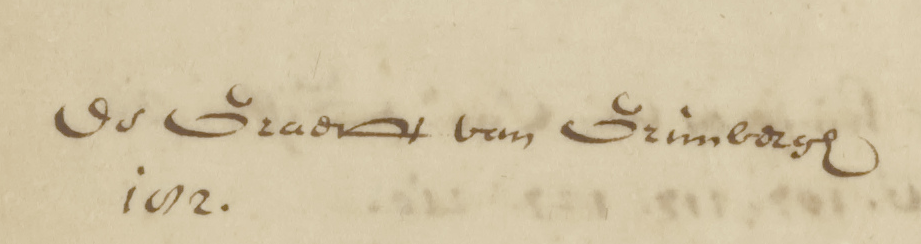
De Graeff van Grunbergh
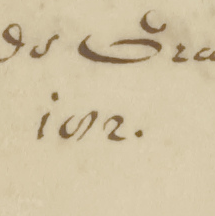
182.
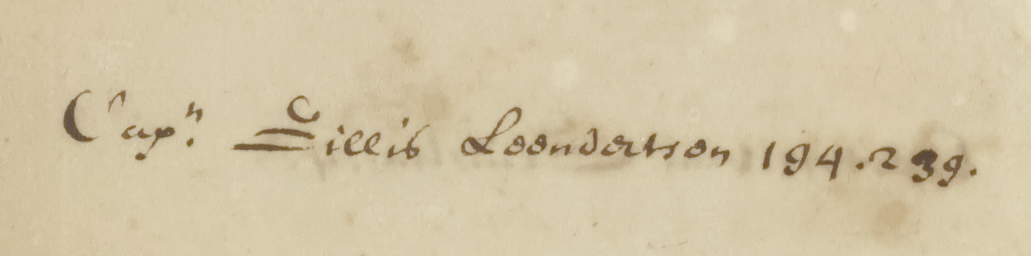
Capn. Gillis Leendertsen 194. 239.
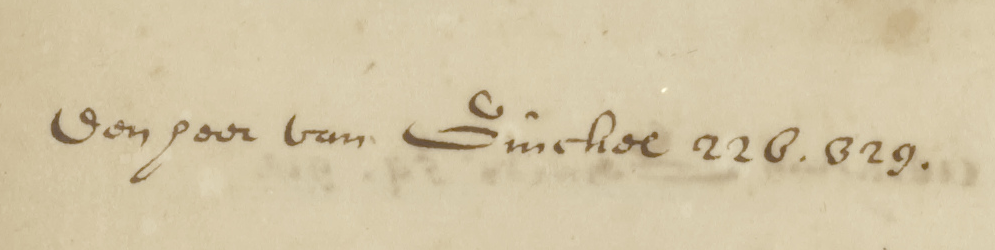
Den heer van Ginckel 226. 329.
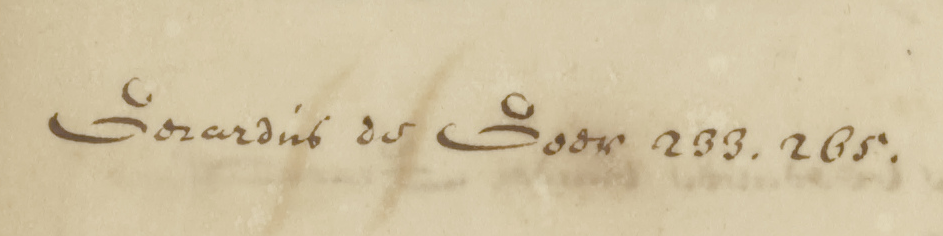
Gerardus de Geer 233. 265.
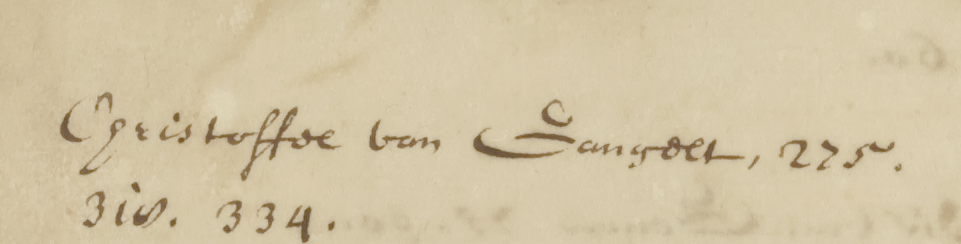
Christoffel van Gangelt, 275.
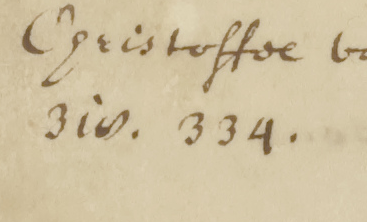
318. 334.
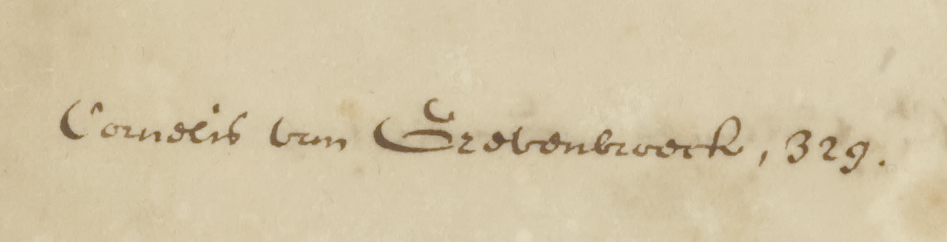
Cornelis van Grevenbroeck, 329.
